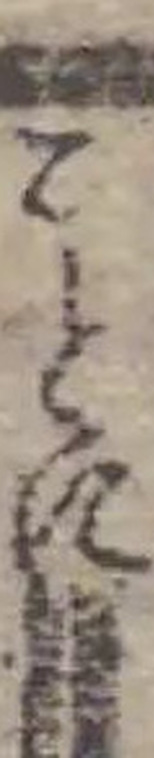ことに
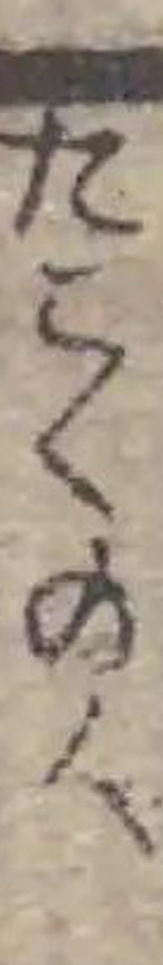たこくの人
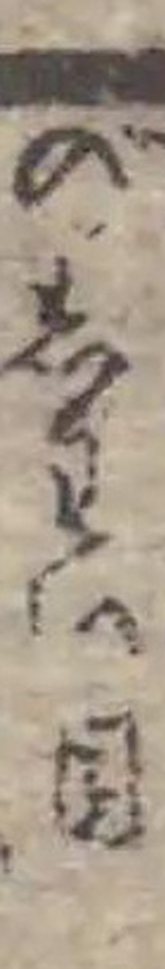のしわい目
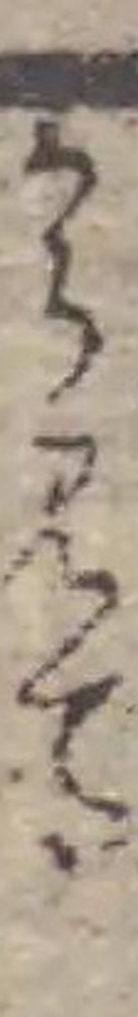から見ては
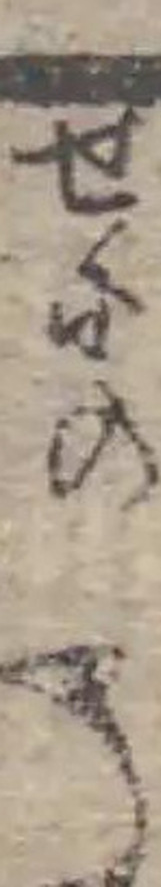せにの
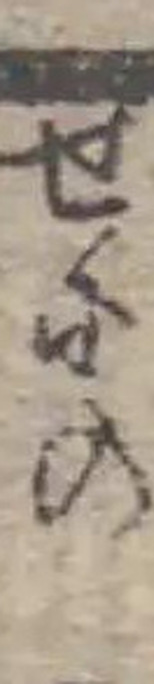せにの
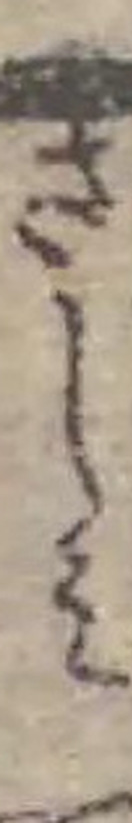さしみ
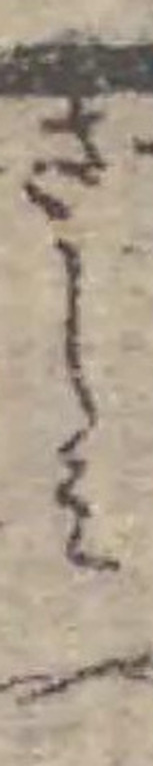さしみ
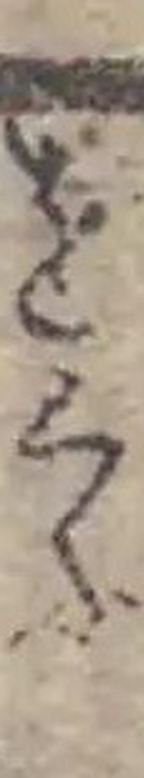をくふ
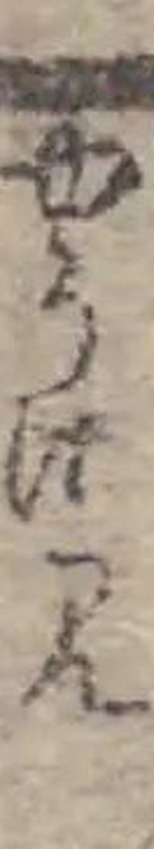やうに見
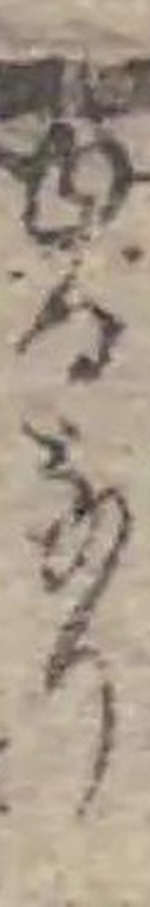ゆるなり
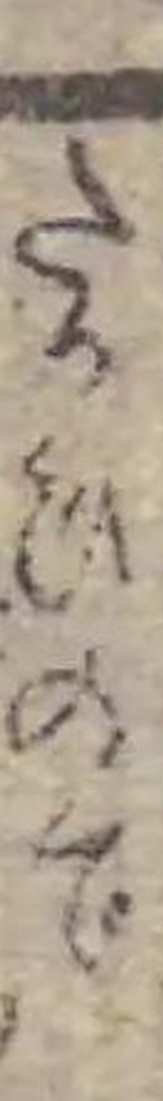たかひので
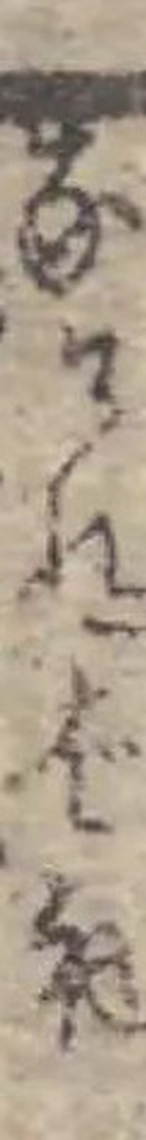なければ初
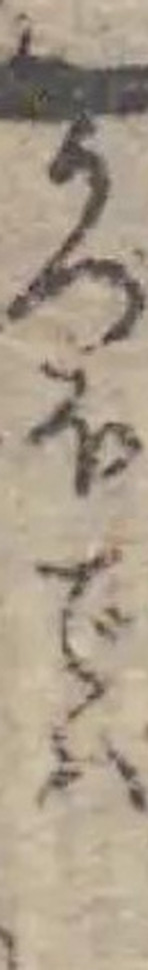かつほでは
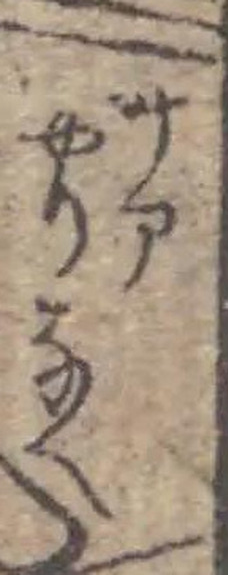やりなへ
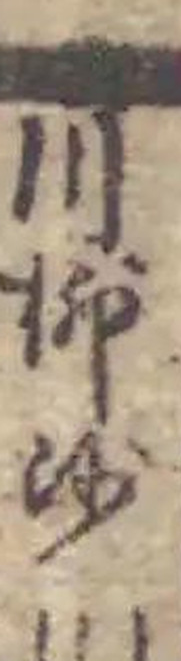川柳沙
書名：作意妖恐懼感心 2巻
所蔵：国立国会図書館 National Diet Library, JAPAN
